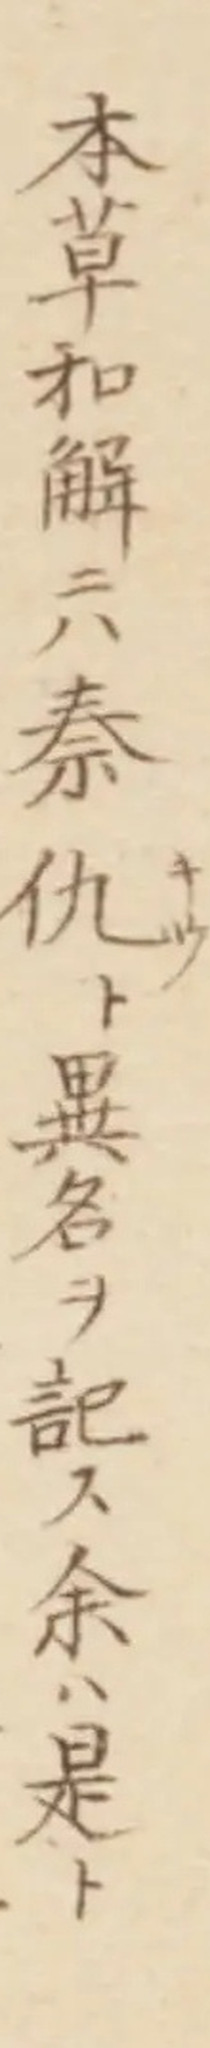本草和解ニハ秦仇異名ヲ記ス余ハ是ト
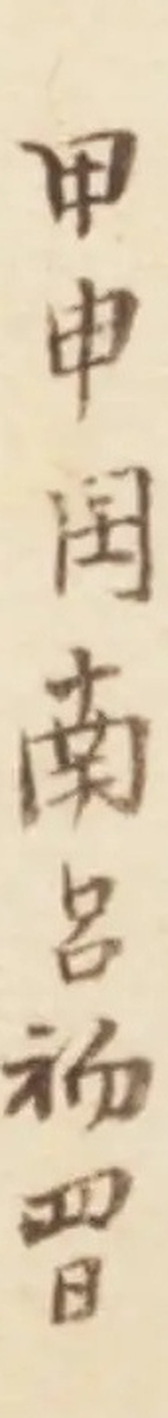甲申閏南呂初四日
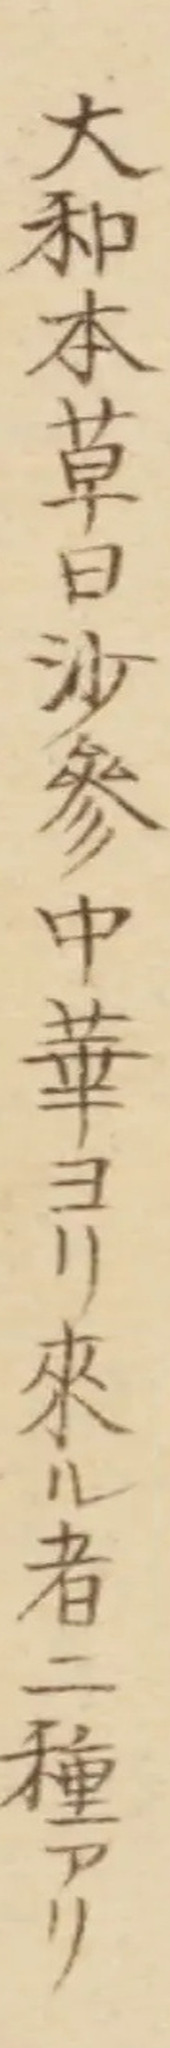大和本草曰沙参中華ヨリ来ル者二種アリ
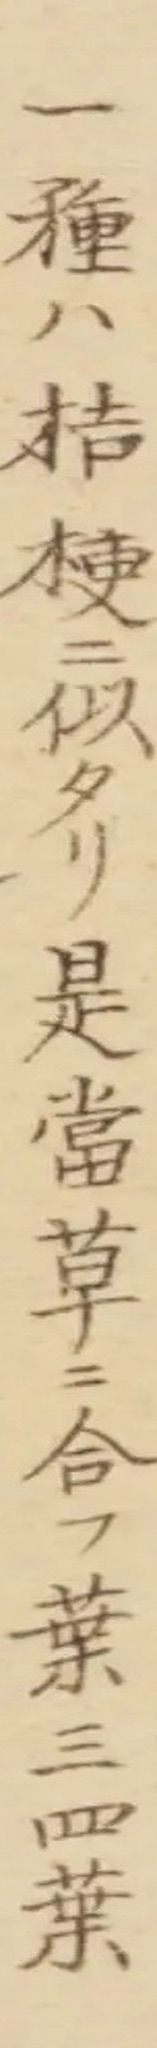一種ハ桔梗ニ似タリ是当草ニ合フ葉三四葉
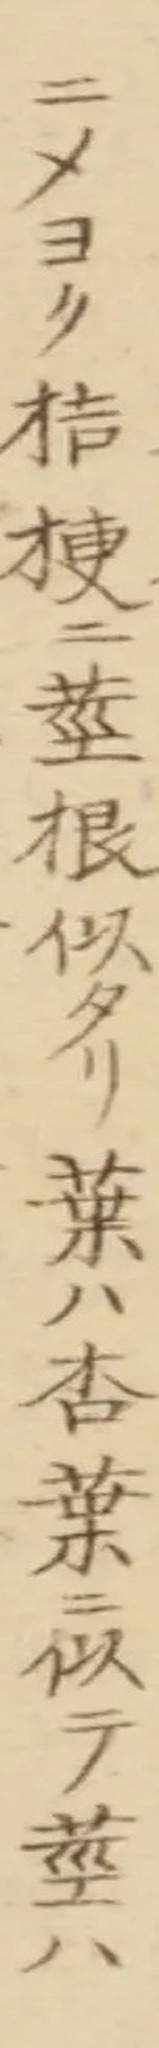ニシテヨク桔梗ニ茎根似タリ葉ハ杏葉ニ似テ茎ハ
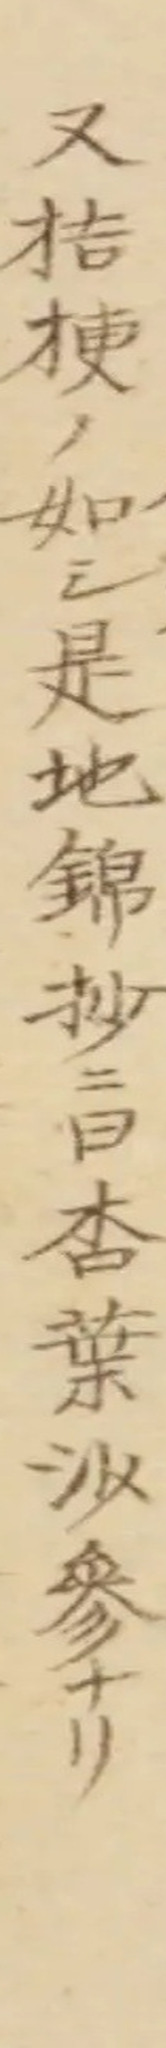又桔梗ノ如シ是地錦抄ニ曰杏葉沙参ナリ
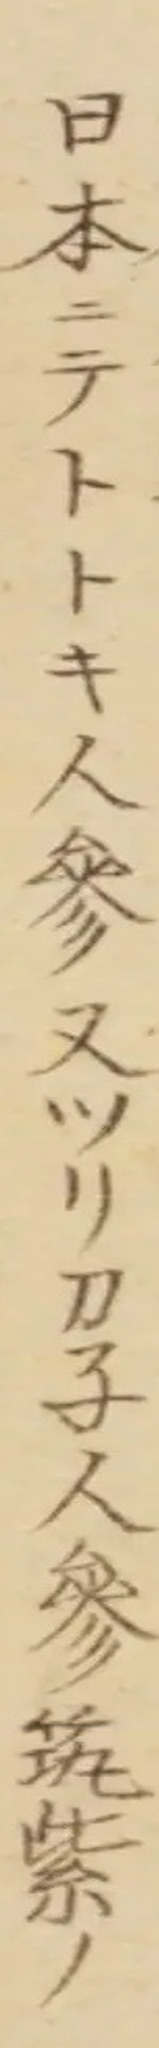日本ニテトトキ人参又ツリカネ人参筑紫ノ
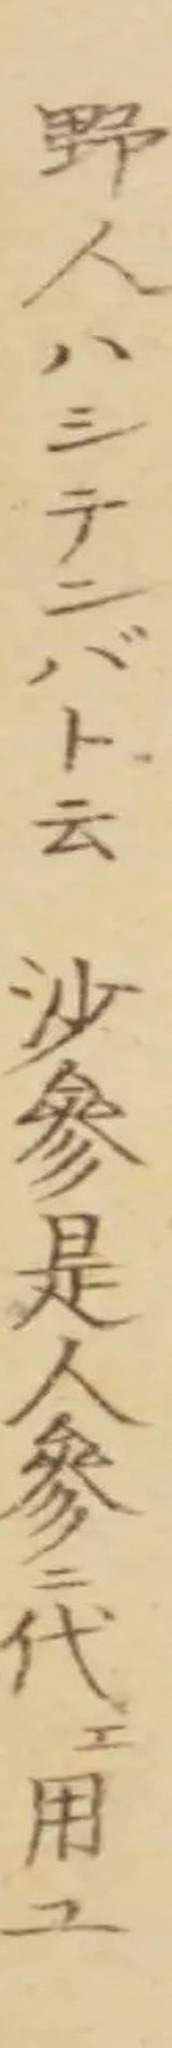野人ハシテンバト云沙参是人参ニ代用ユ

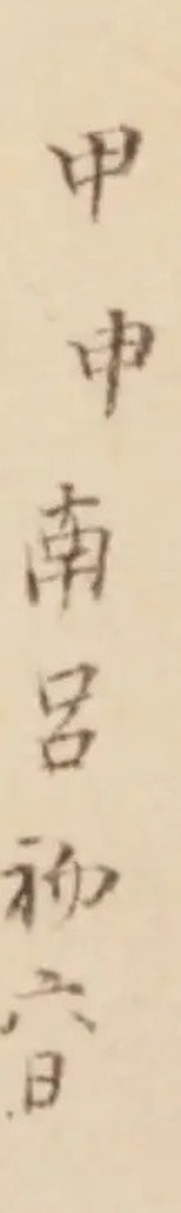甲申南呂初六日
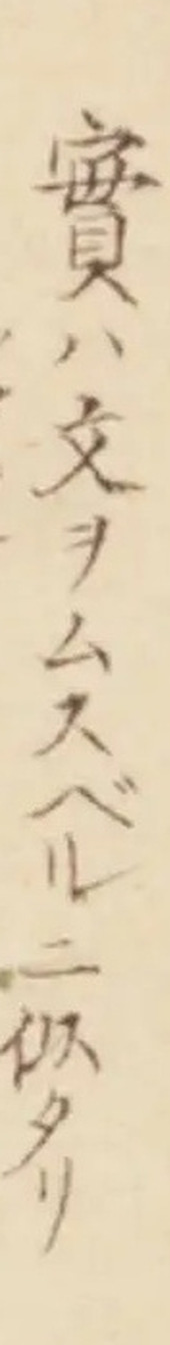実ハ文ヲムスベルニ似タリ

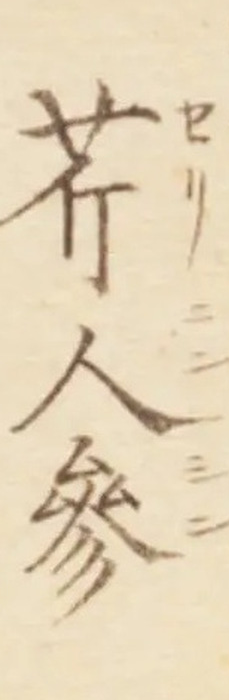芹人参
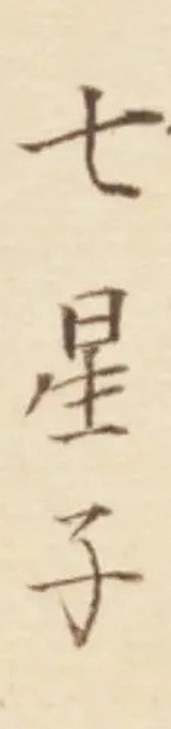七星子
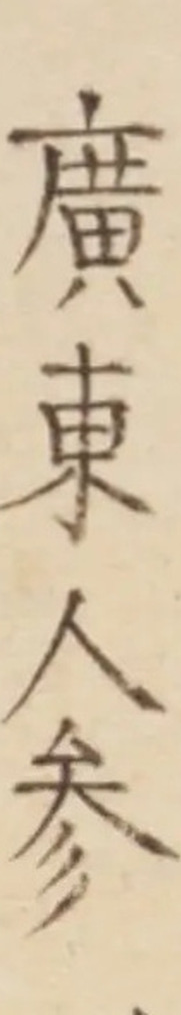広東人参
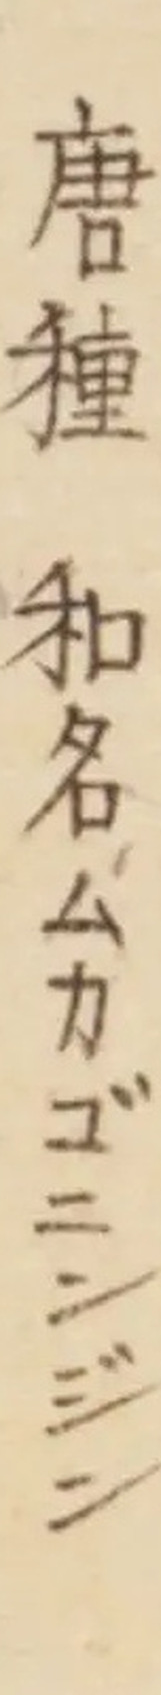唐種和名ムカゴニンジン
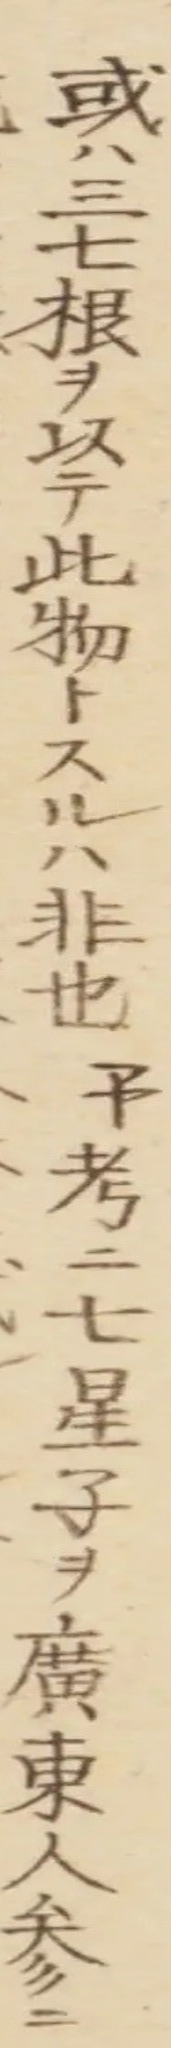或ハ三七根ヲ以テ此物トスルハ非也予考ニ七星子ヲ広東人参ニ
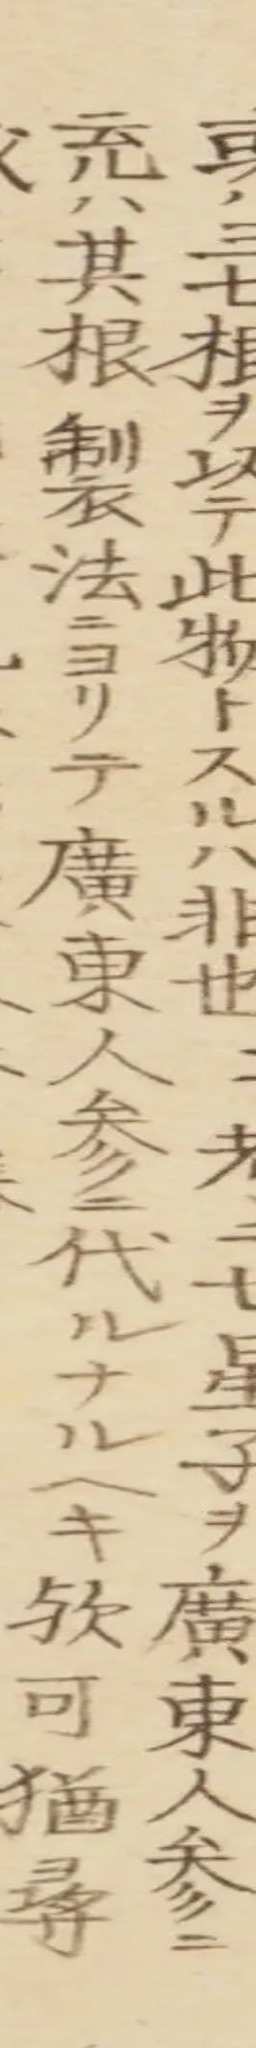充ハ其根製法ニヨリテ広東人参ニ代ルナルヘキ歟可猶尋
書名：梅園草木花譜秋之部. 2
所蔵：国立国会図書館 National Diet Library, JAPAN
